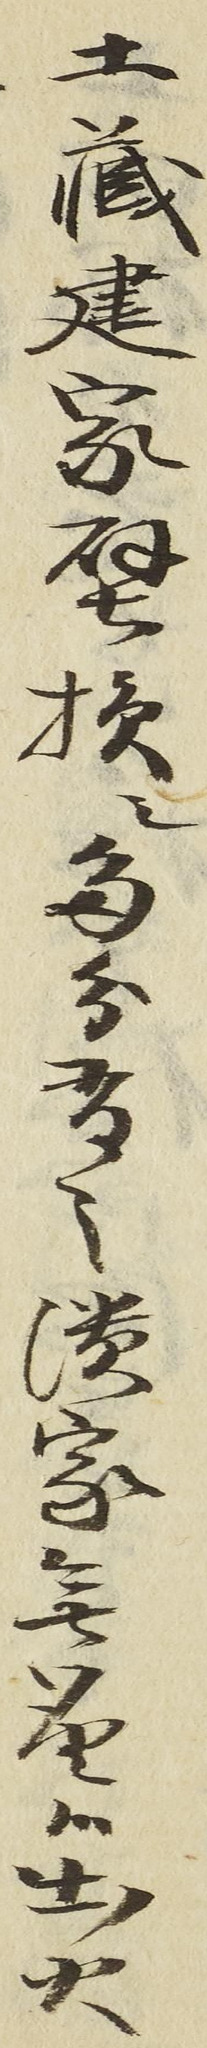土蔵建家壁損ㇱ多分有之潰家無御座出火
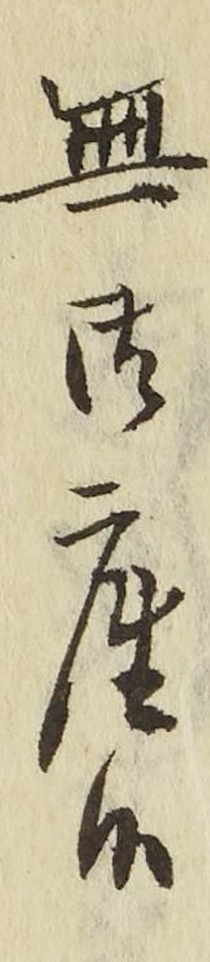無御座候
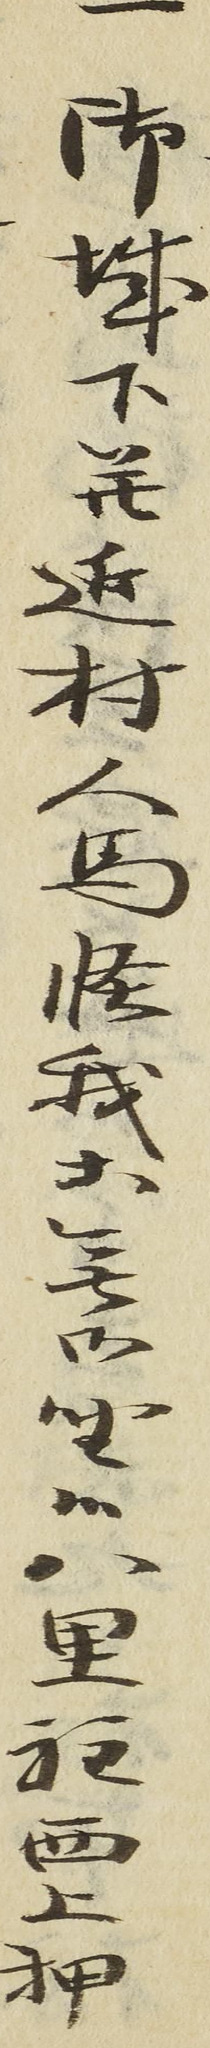一御城下并近村人馬怪我等無御座候八里程西上押
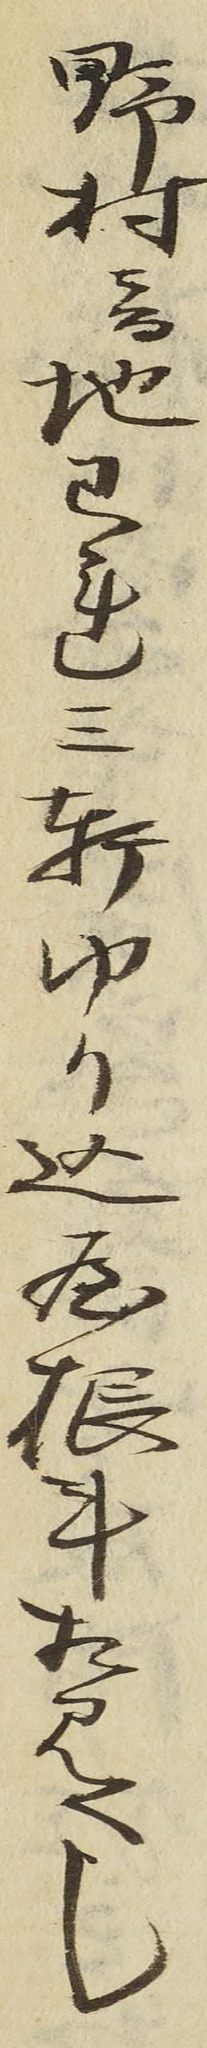野村二而地われ三軒ゆり込屋根斗相見へ申候

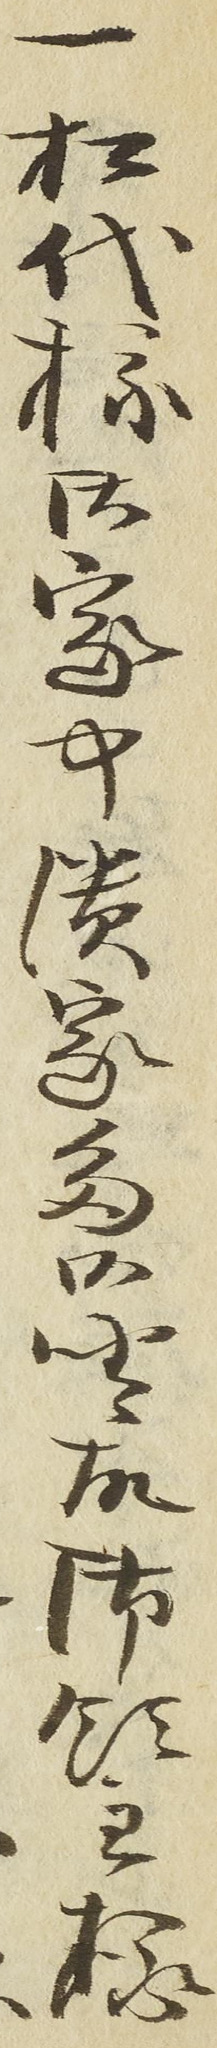一松代様御家中潰家多御坐候故御領主様
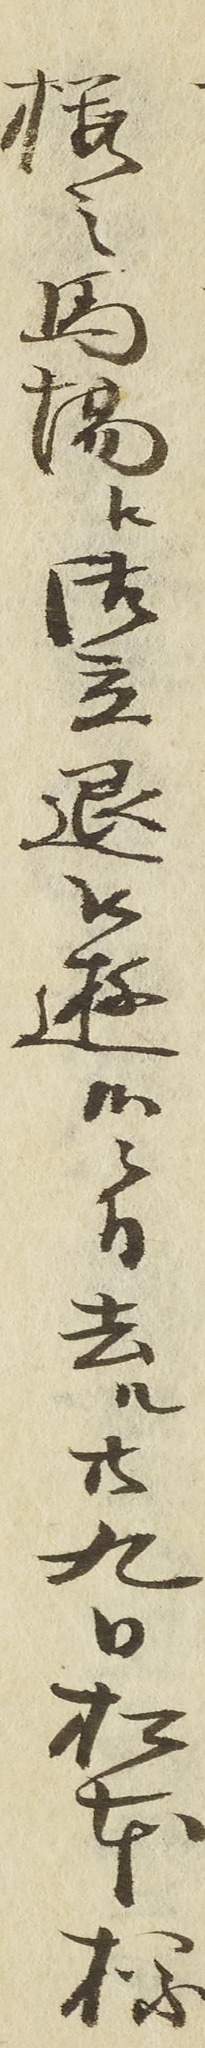桜之馬場江御立退被遊候二付去ㇽ廿九日松本様
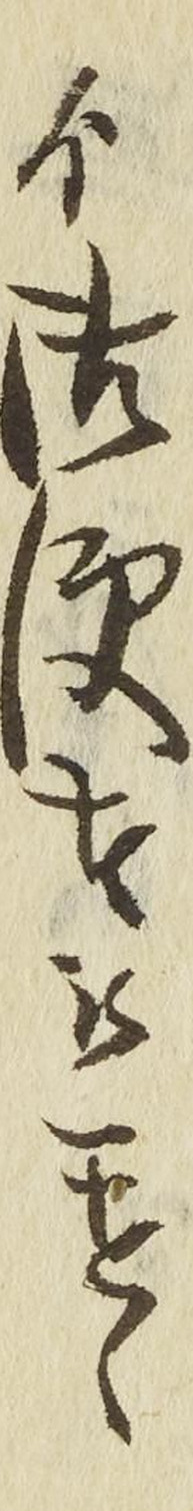ゟ御便を被遣候
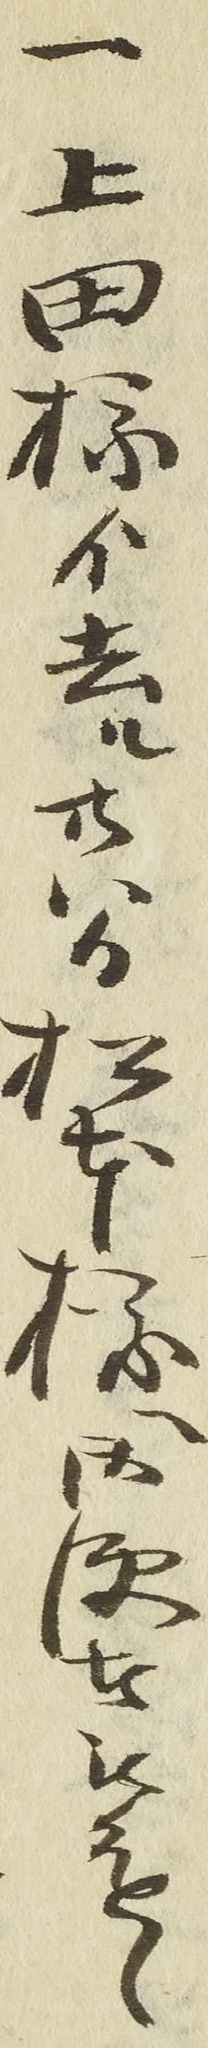一上田様ゟ去ル廿八日松本様へ御便は被遣候
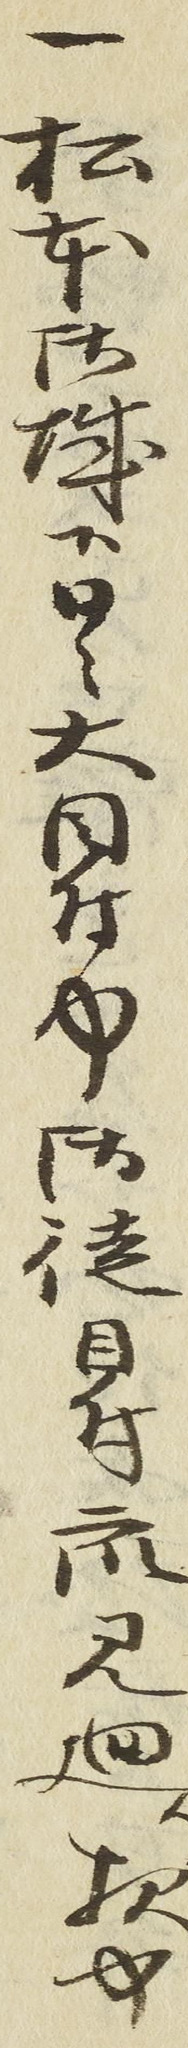一松本御城下日々大目付中御徒目付衆見廻り夜中
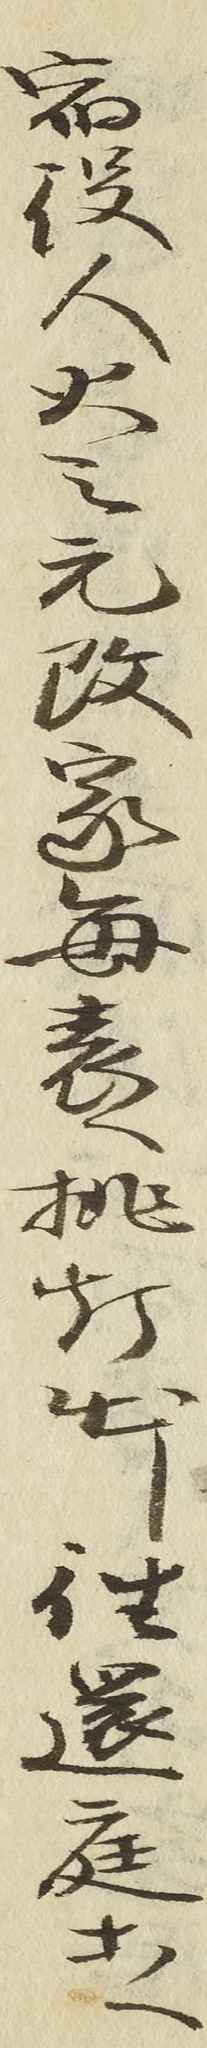宿役人火之元改家毎表へ挑灯出し往還庭等へ
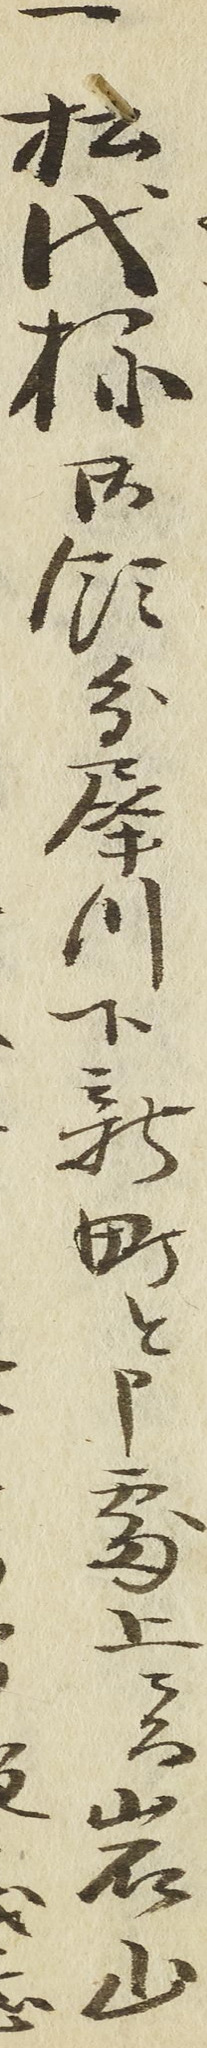一松代様御領分犀川下新町と申処上二而岩山
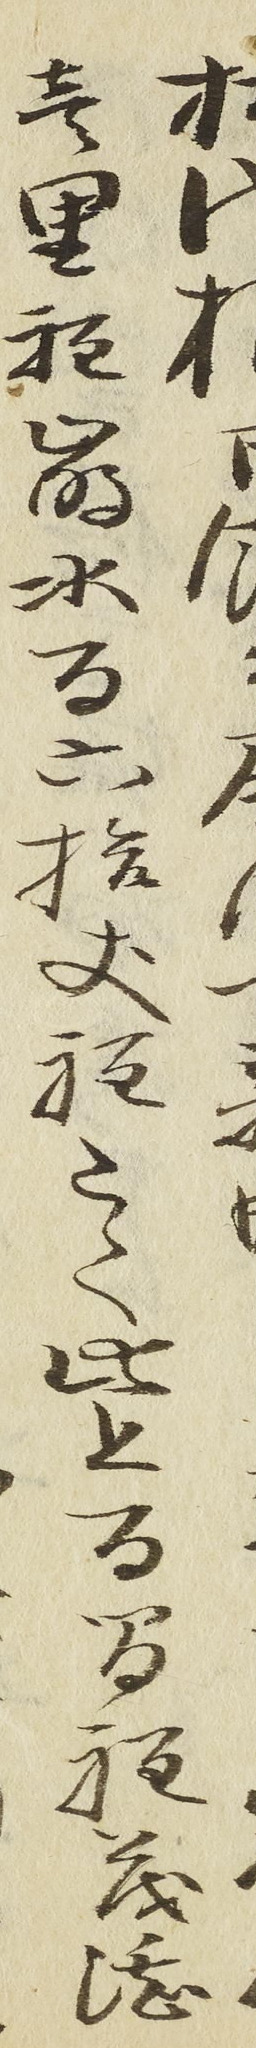壱里程崩水百六拾丈程たゝへ此上百間程も湛
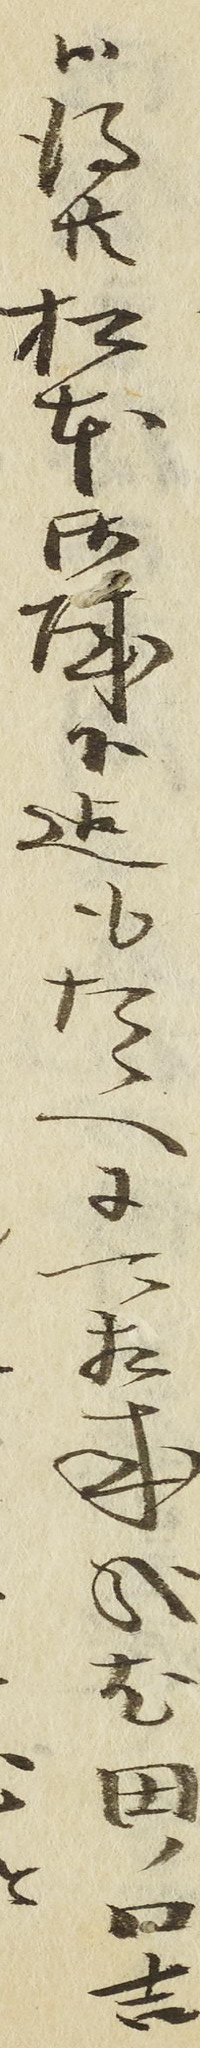候得共松本御城下迄もたゝへに可相成哉尤田ノ口吉
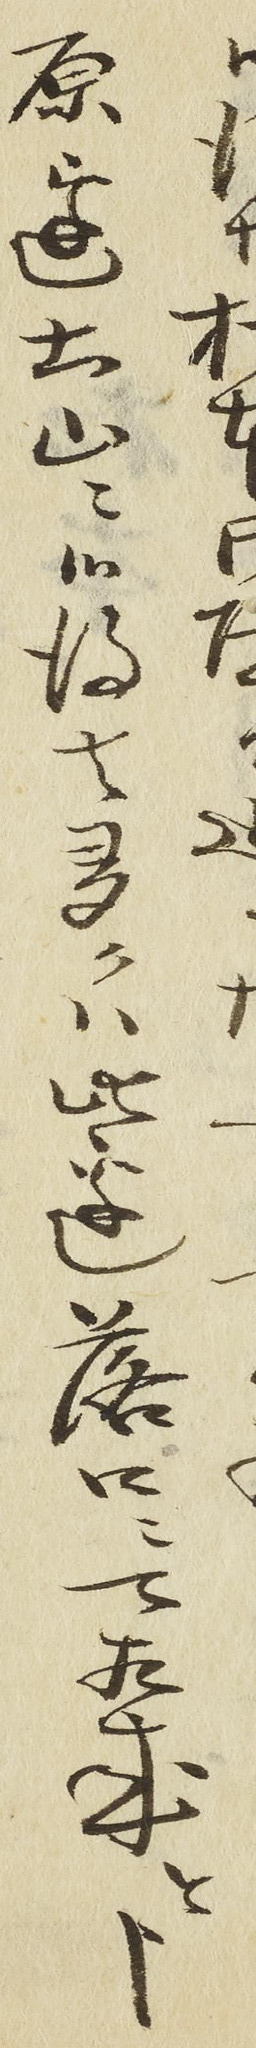原辺大山二候得は多クハ此辺落口二可相成と申
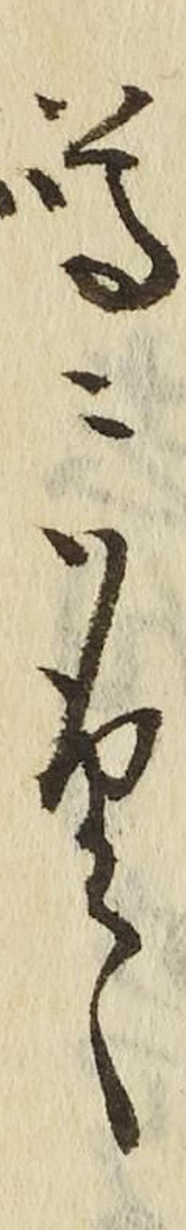噂二御座候
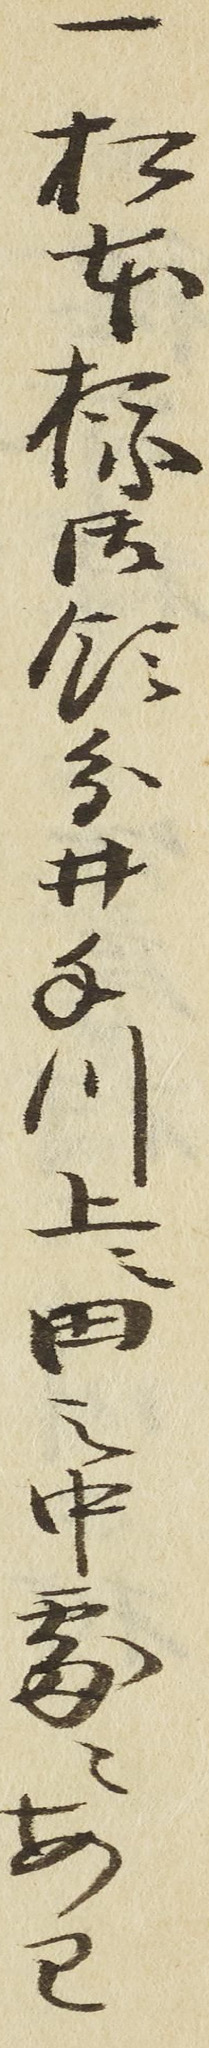一松本様御領分井手川上之田之中処々あわ
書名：信濃國大地震記　乾
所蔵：東京大学地震研究所図書室 Earthquake Research Institute Library, The University of Tokyo, JAPAN
